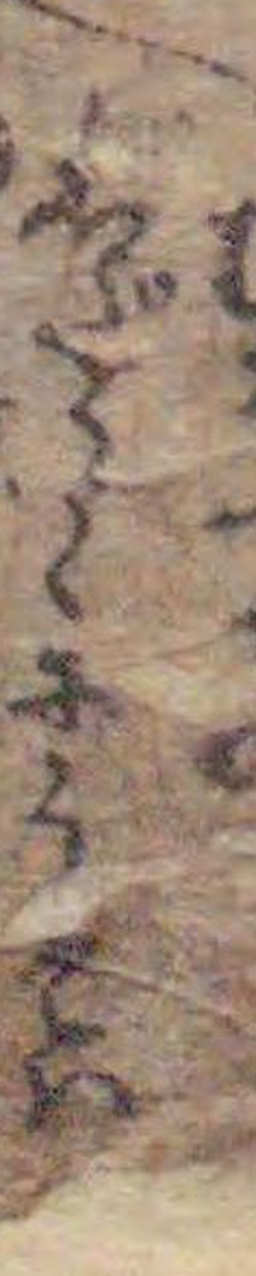じだらくにうそは
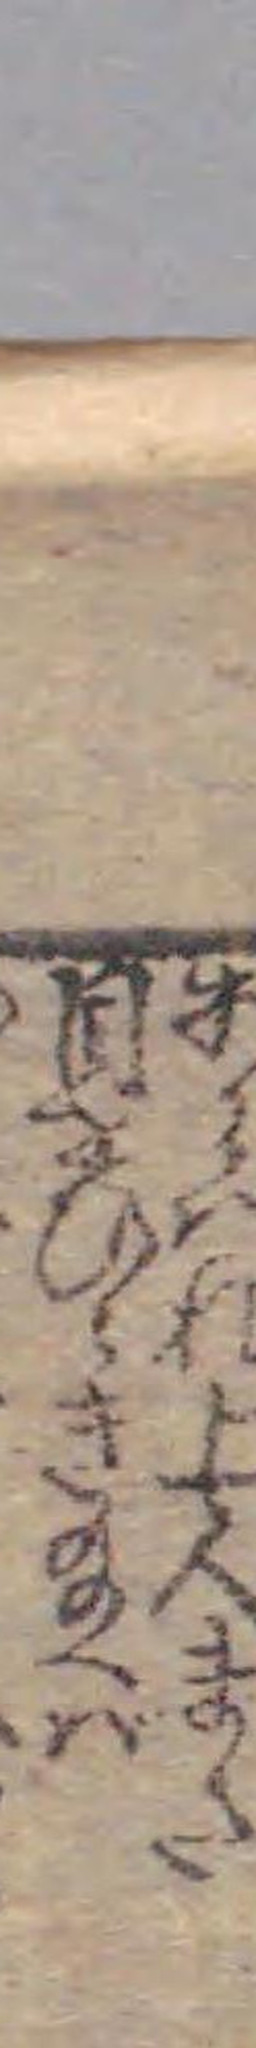目をひらき給へば
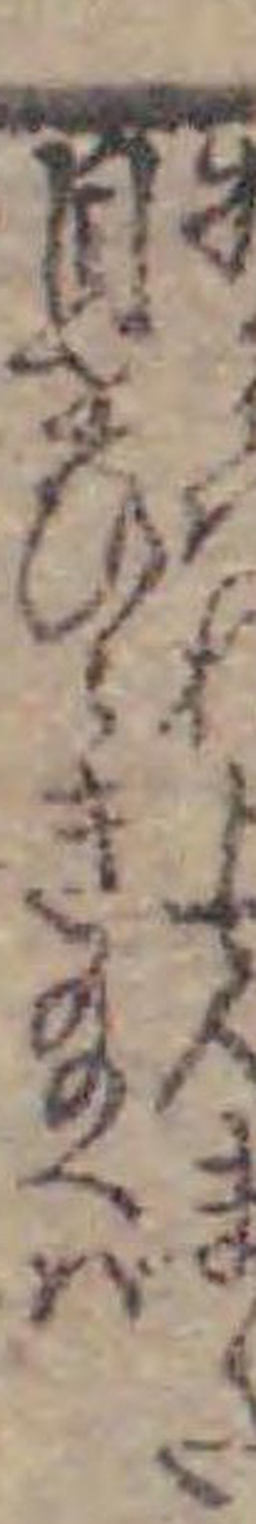目をひらき給へば
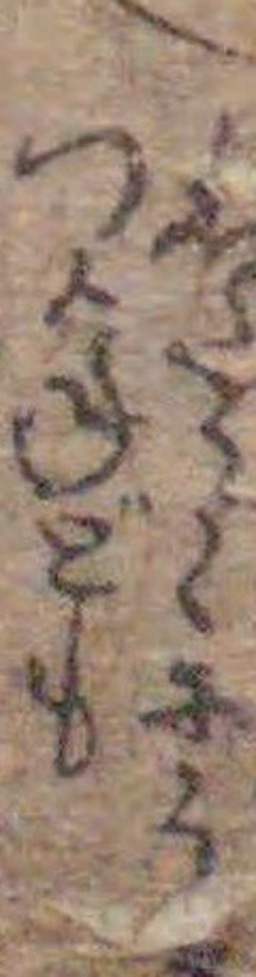つかねども
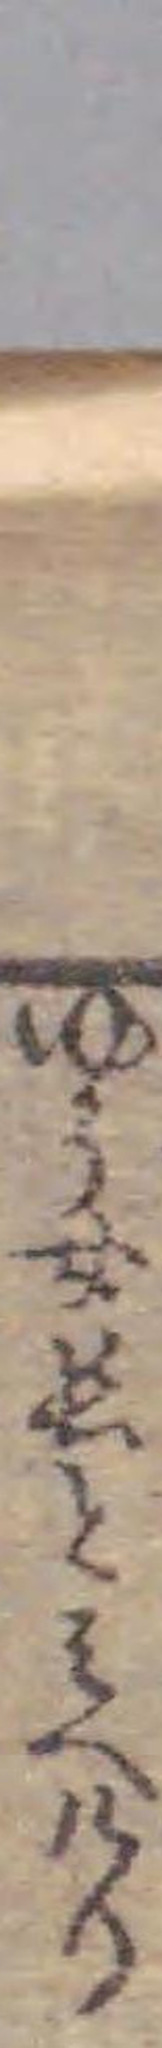ゆう女長とみへけり
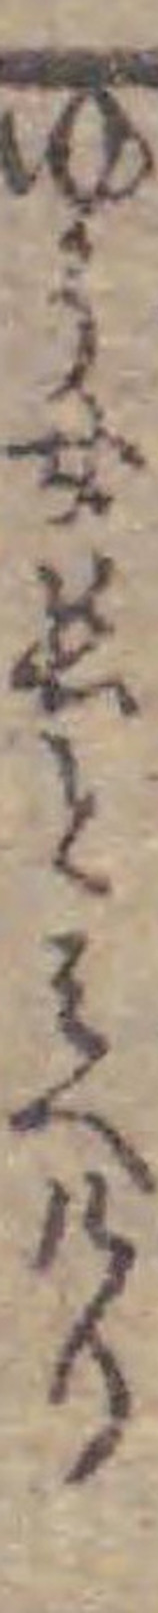ゆう女長とみへけり
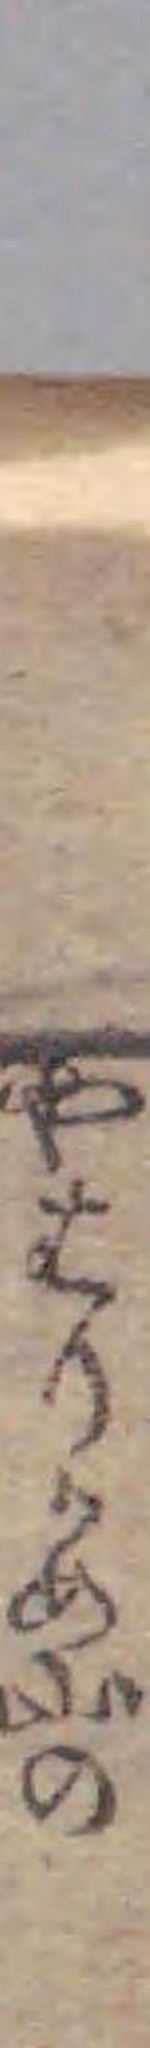やはりかめ山の
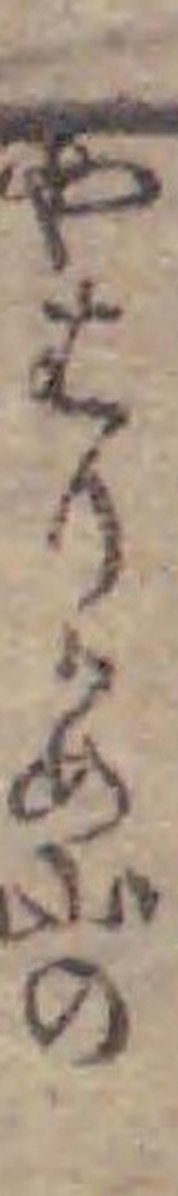やはりかめ山の
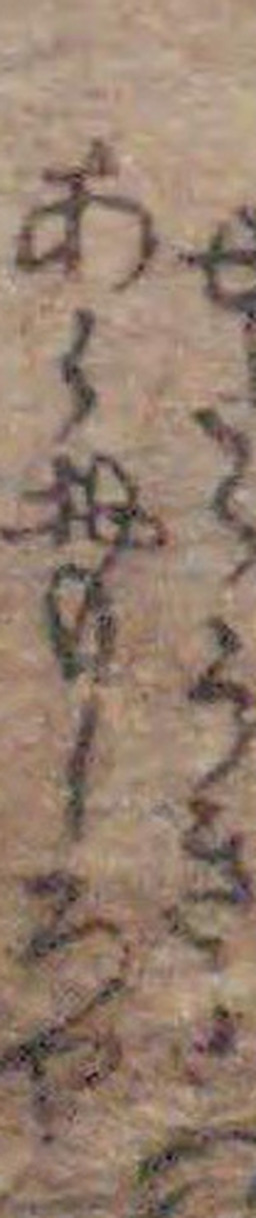あらおもしろや
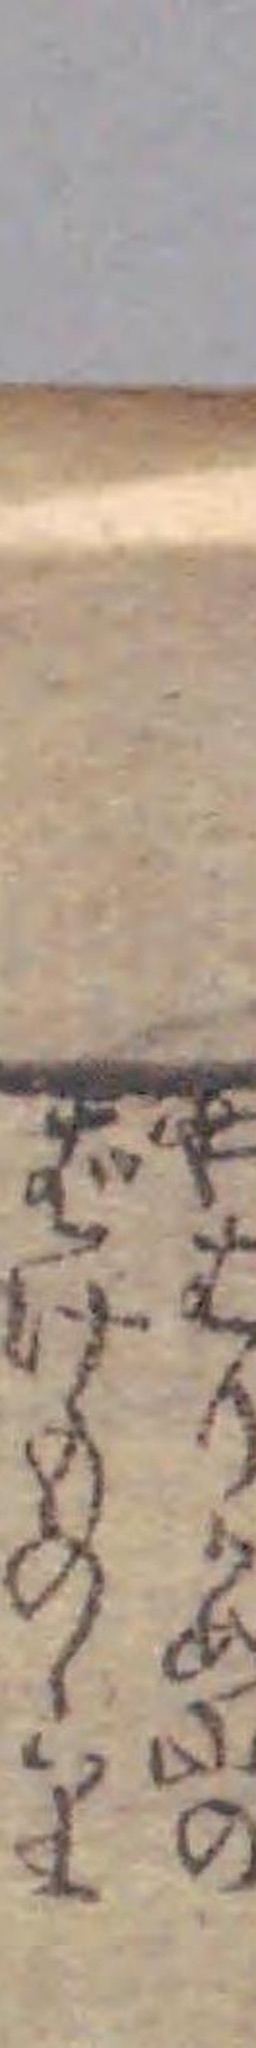ばけものゝ里
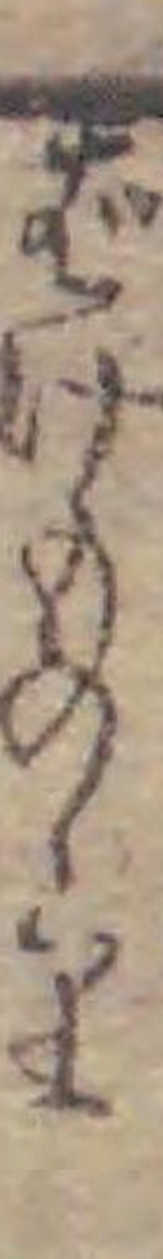ばけものゝ里
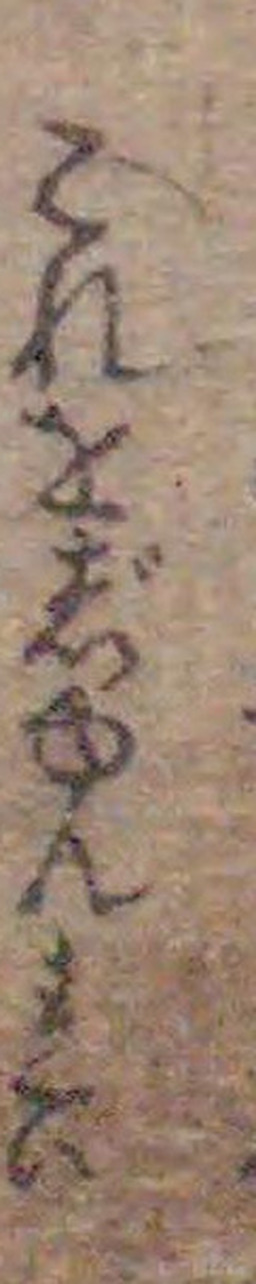これをじゆんれい
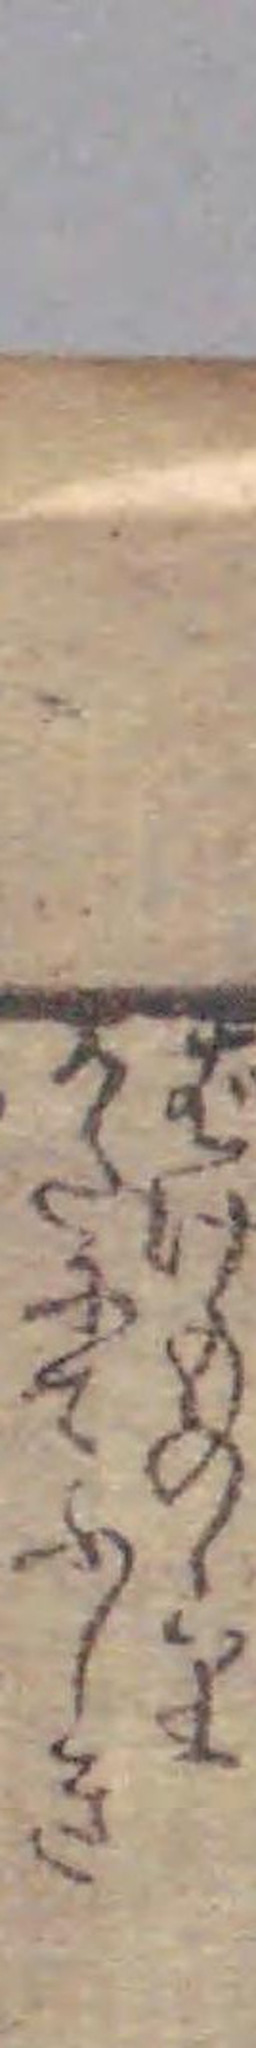かたにてふしき
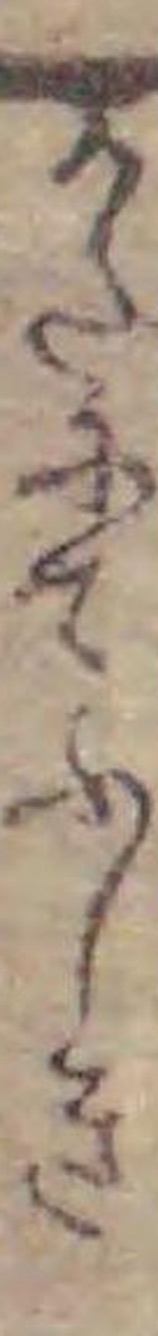かたにてふしき
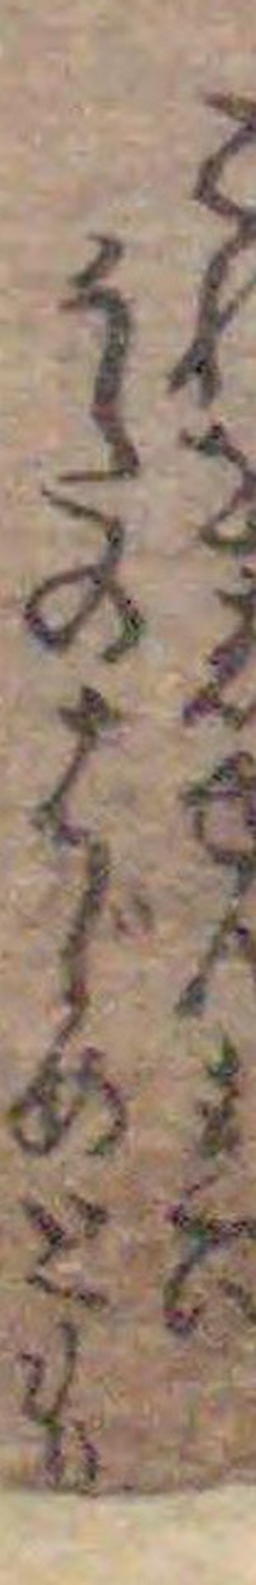うたのはじめとも
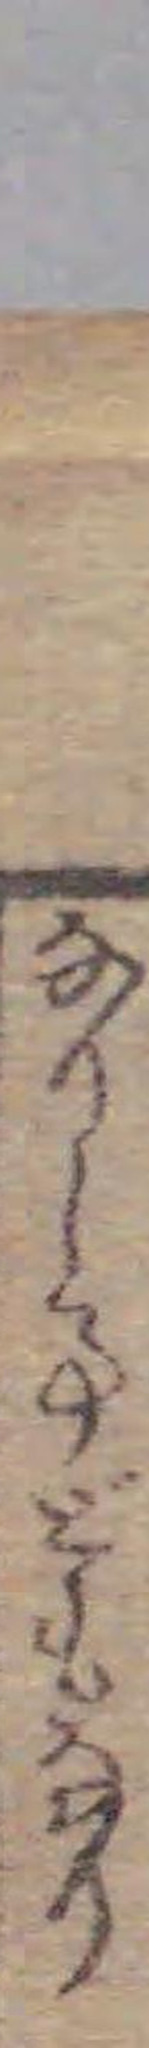なりし事どもなり
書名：北国順礼唄方便 : 3巻
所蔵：国立国会図書館 National Diet Library, JAPAN
